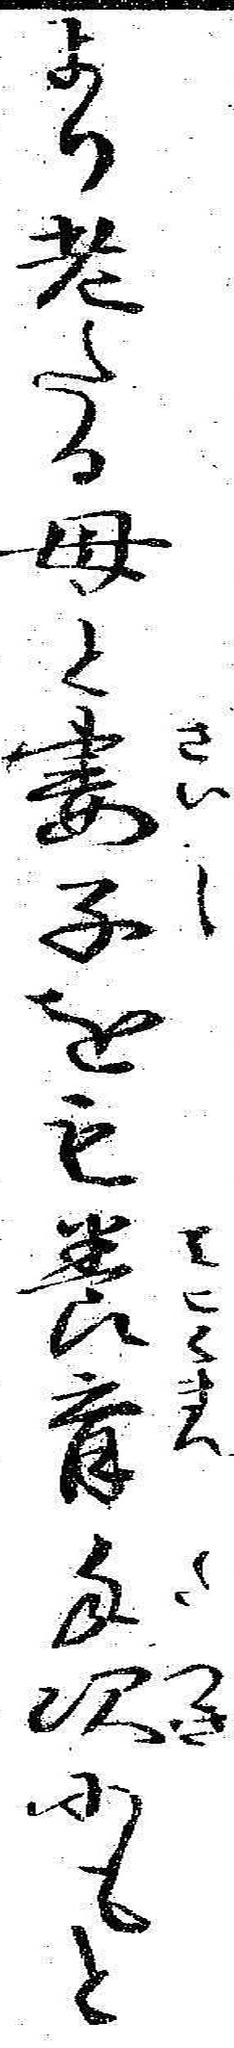より老たる母と妻子をも養育手次にもと
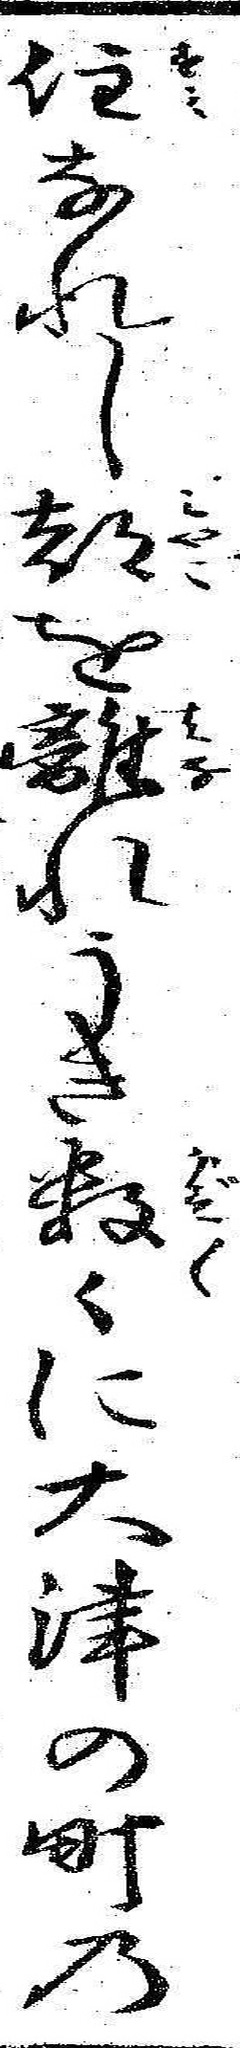住なれし都を離れうき数々に大津の町の
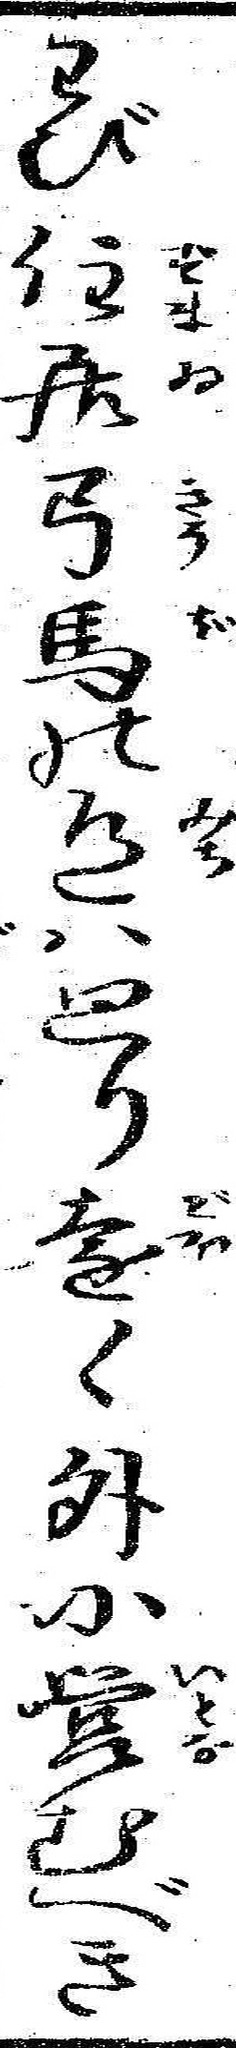わび住居弓馬の道は廻り遠く外に営むべき
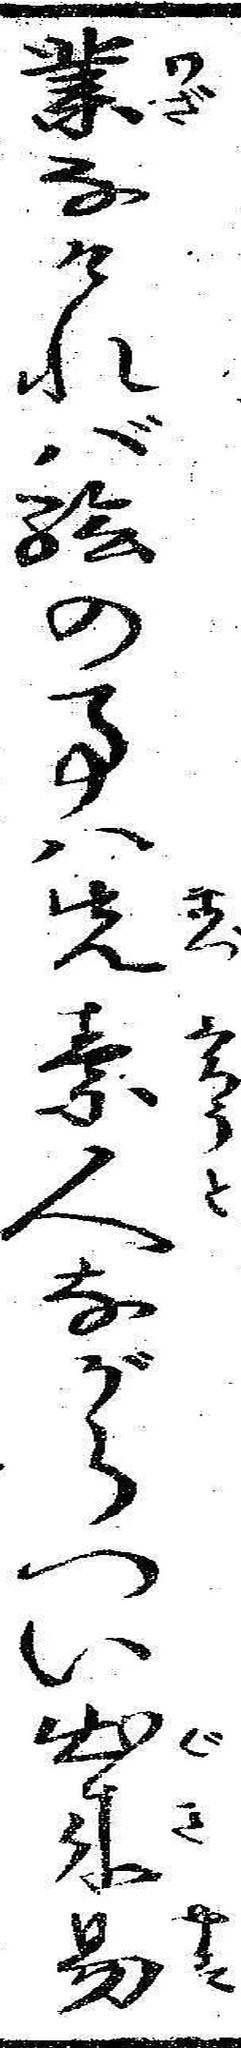業なければ絵の事は先素人ながらつい出来易
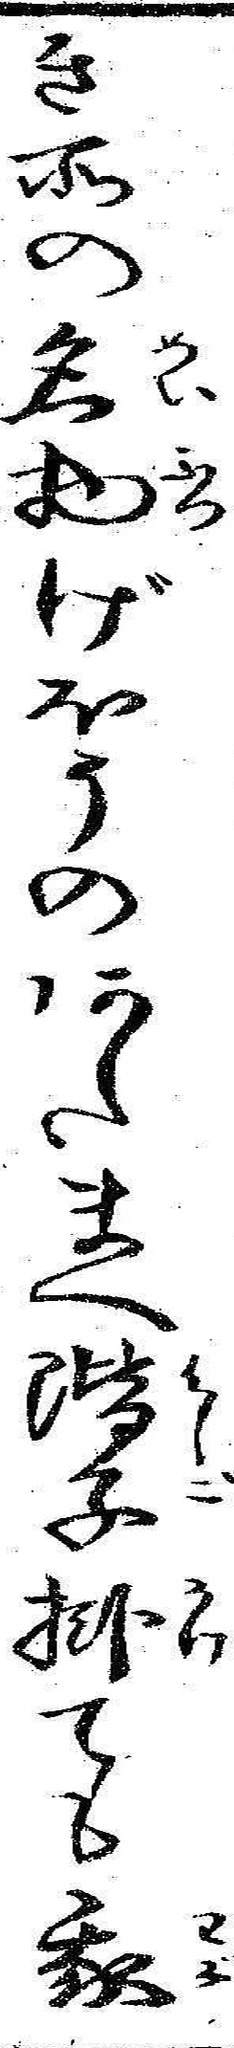き所の名物げほうのあたまへ階子掛ても我
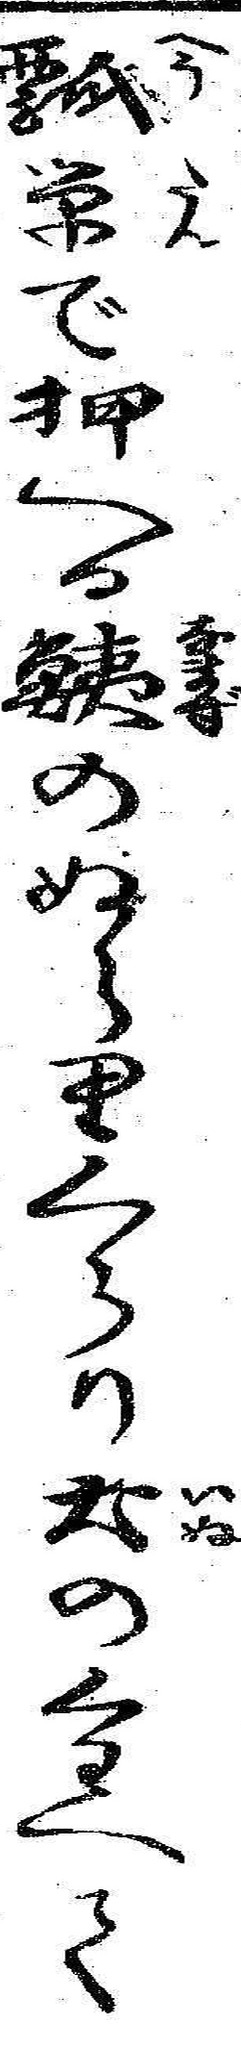瓢単で押へる鮧のぬらりくらり犬のくわへて
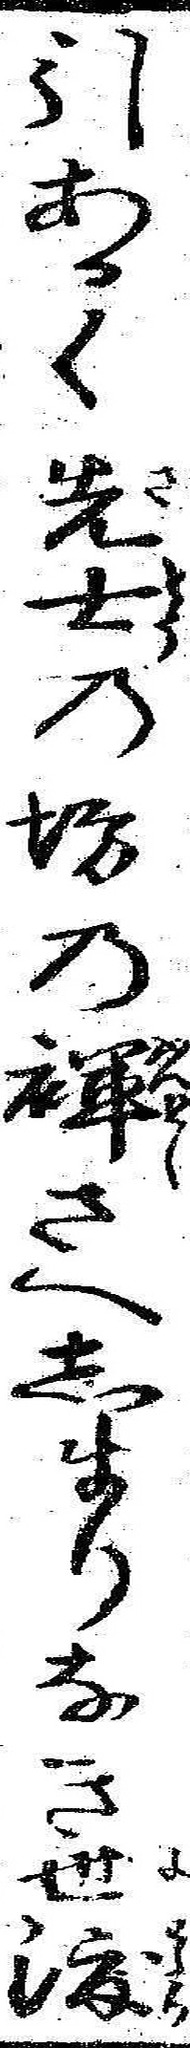引あるく先士の坊の褌さへしまりなき世渡
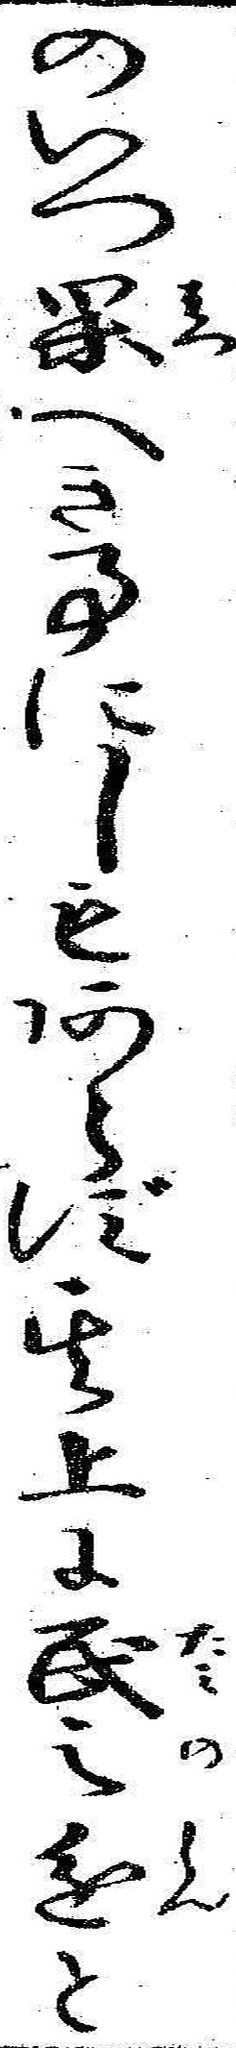のいつ果へき事にしもあらず其上に民之進と
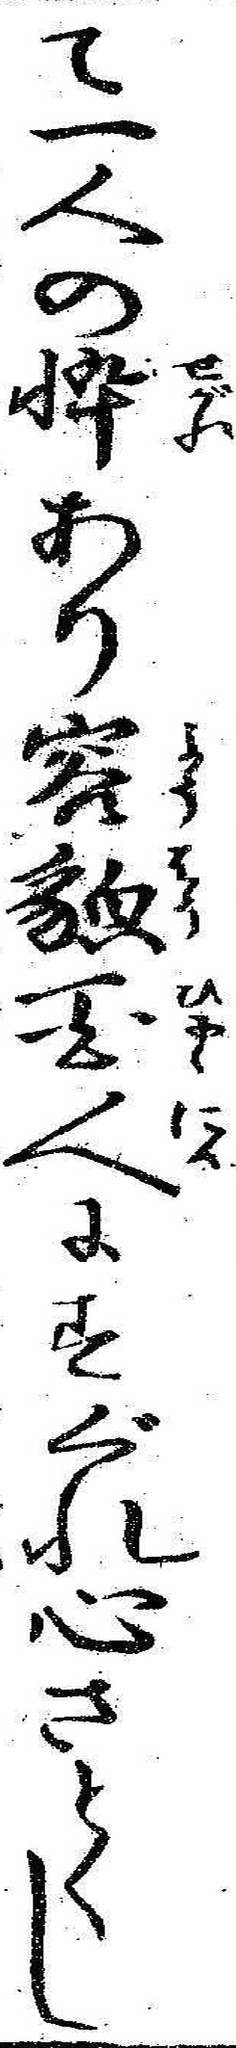て一人の忰あり容貌百人にすぐれ心さとくし
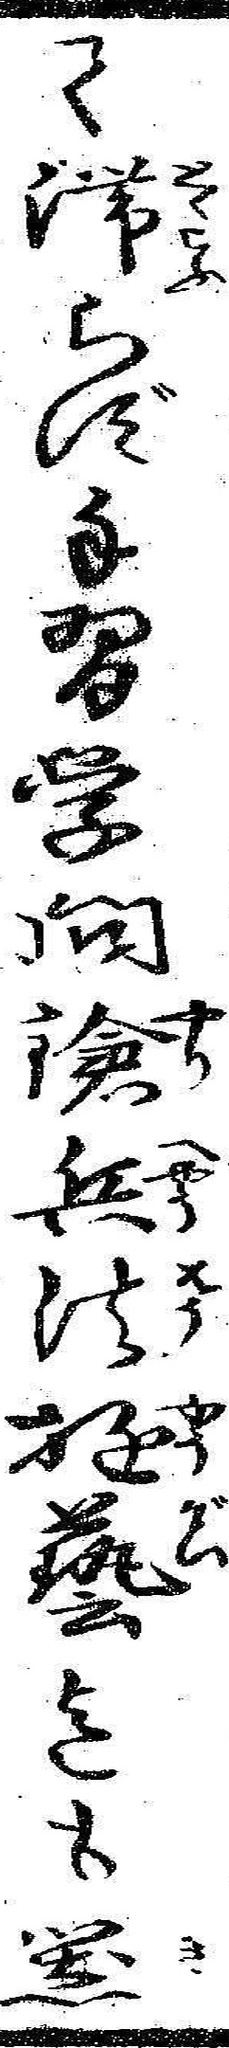て滞らず手習学問槍兵法遊芸迄も器
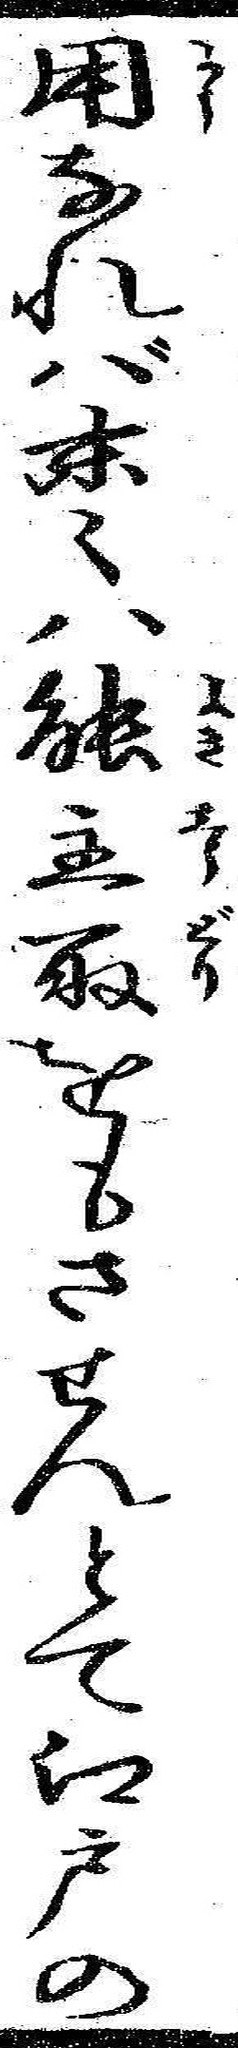用なれば末々は能主取をもさせんとて江戸の
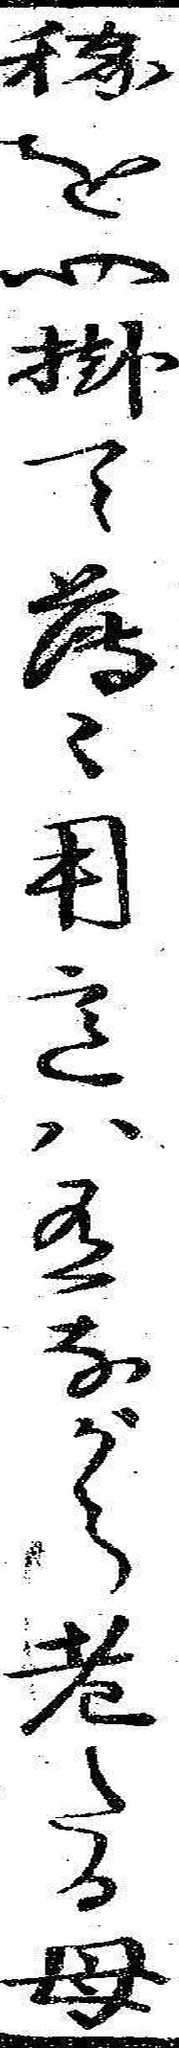稼を心掛て薄々用意は有ながら老たる母
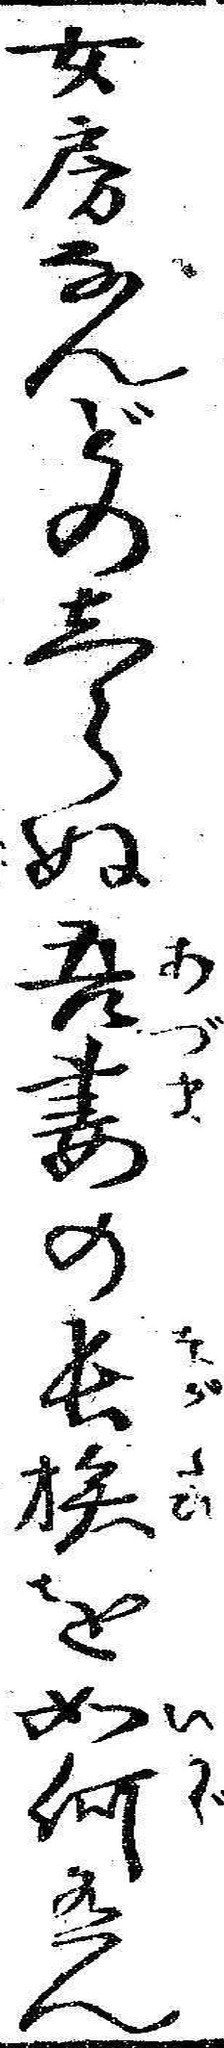女房なんどのしらぬ吾妻の長旅を如何有ん
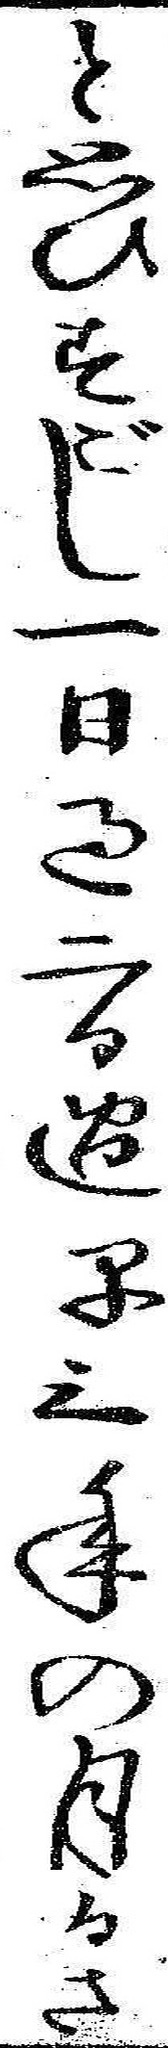と思ひすごし一日過二日過早三年の月日さ
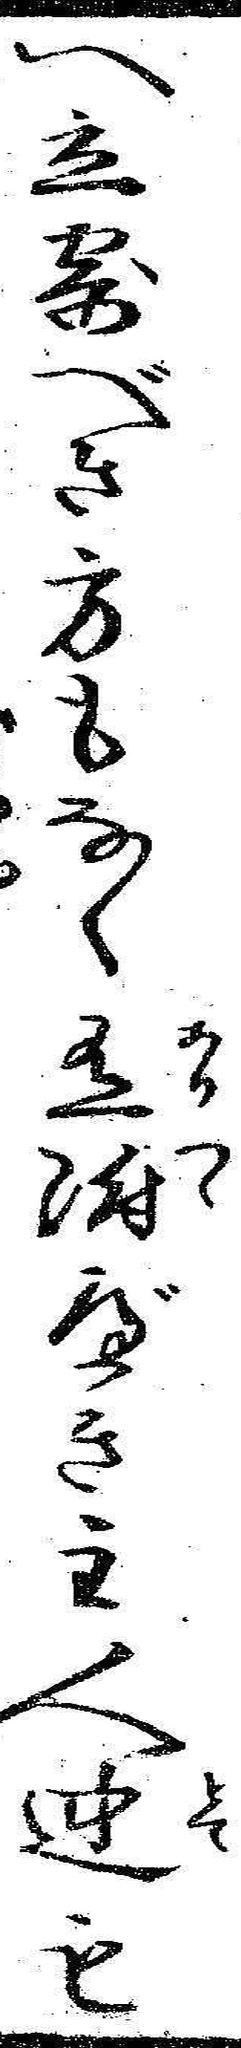へ立寄べき方もなく有附べき主人迚も
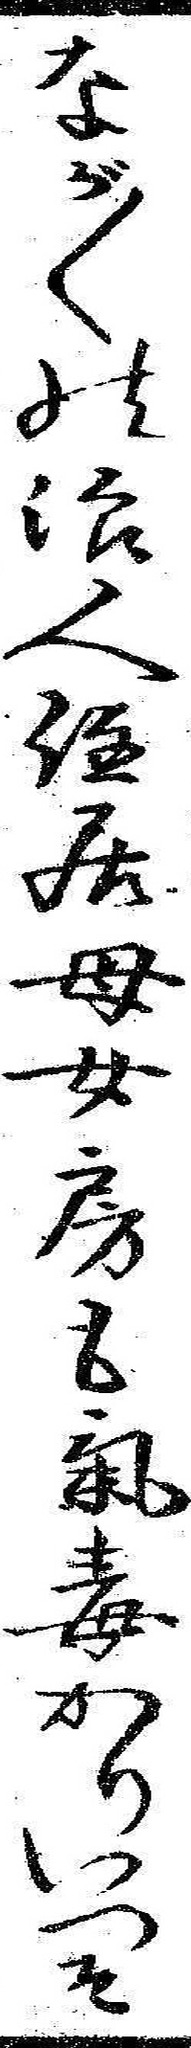なが〱の浪人住居母女房も気毒かりいつそ
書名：根無草後編
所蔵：国文学研究資料館
